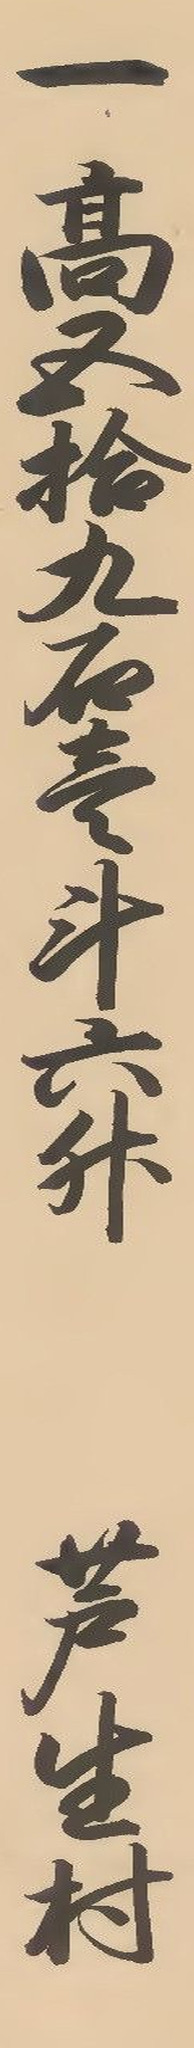一高五拾九石壱斗六升芦生村
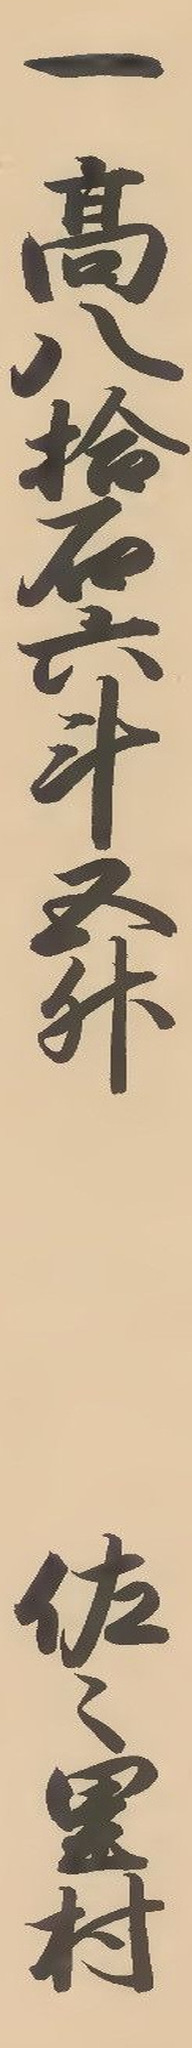一高八拾石六斗五升佐々里村
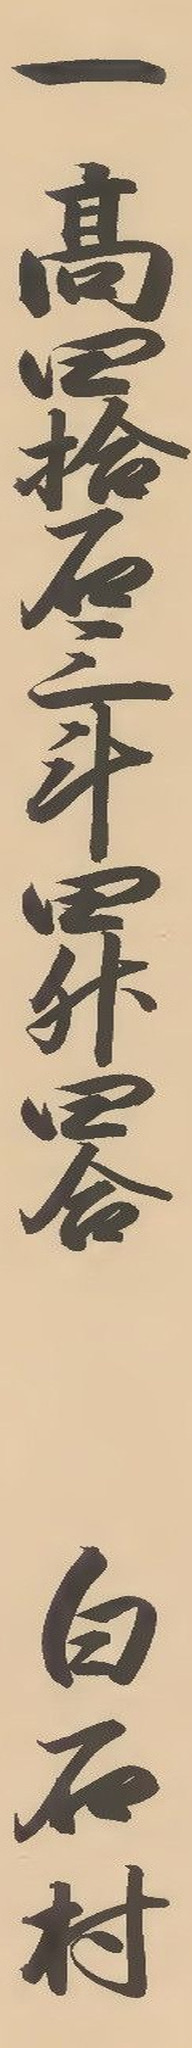一高四拾石三斗四升四合白石村
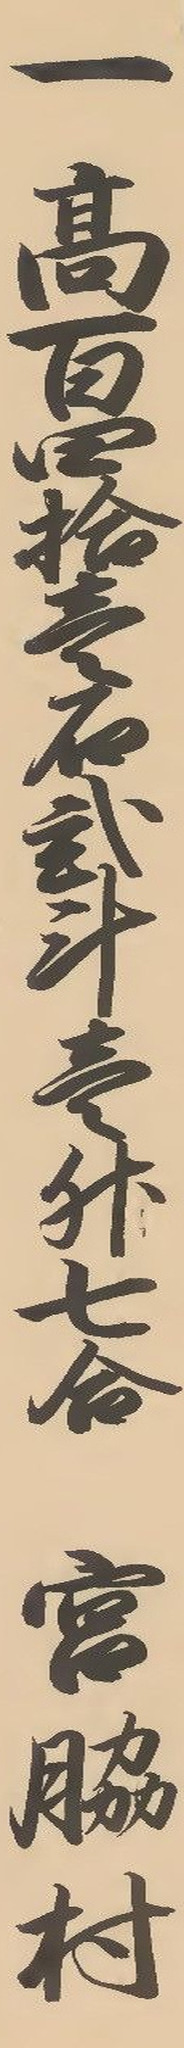一高百四拾壱石弐斗壱升七合宮脇村
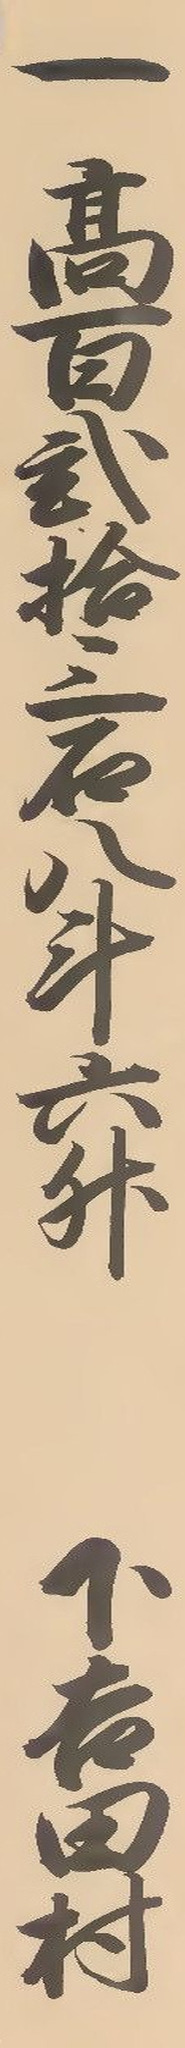一高百弐拾三石八斗六升下吉田村
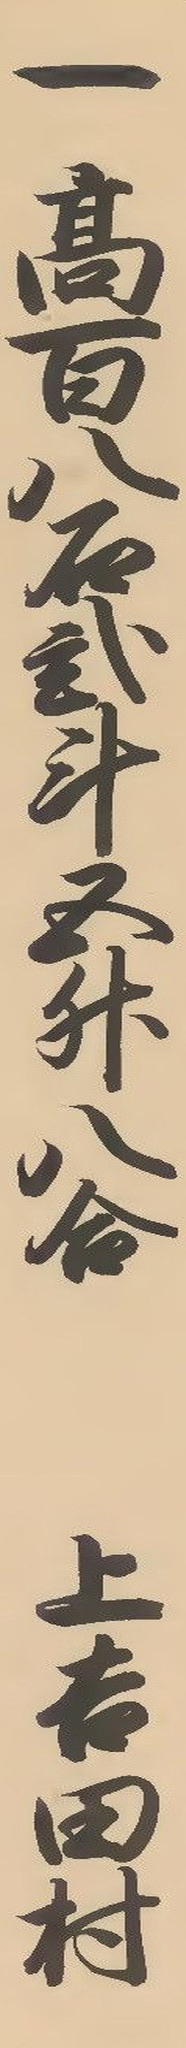一高百八石弐斗五升八合上吉田村
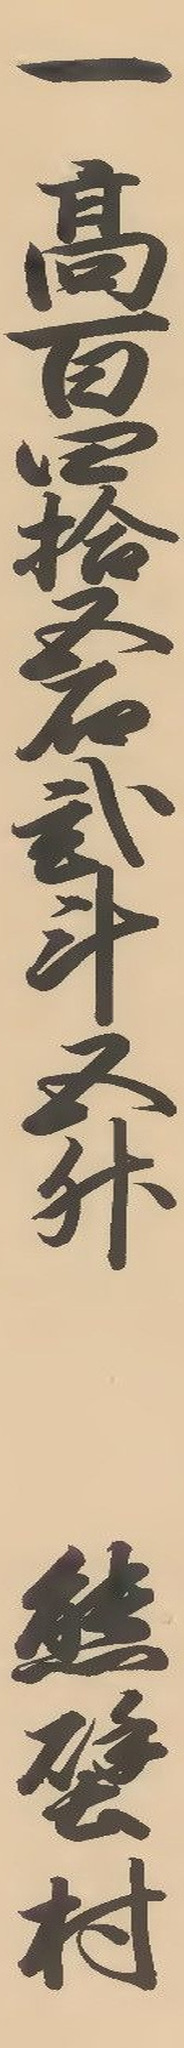一高百四拾五石弐斗五升熊壁村
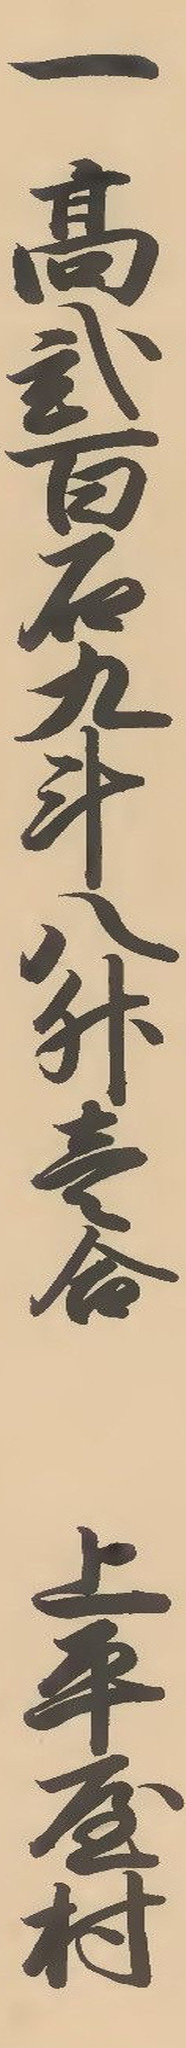一高弐百石九斗八升壱合上平屋村

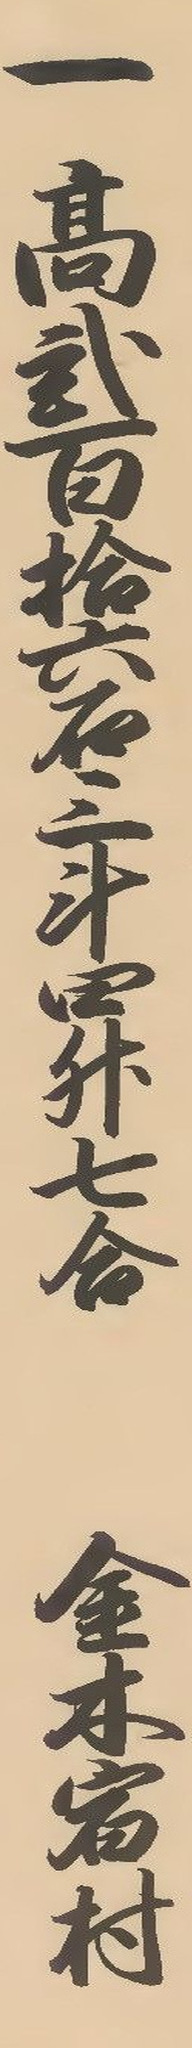一高弐百拾六石三斗四升七合金木宿村
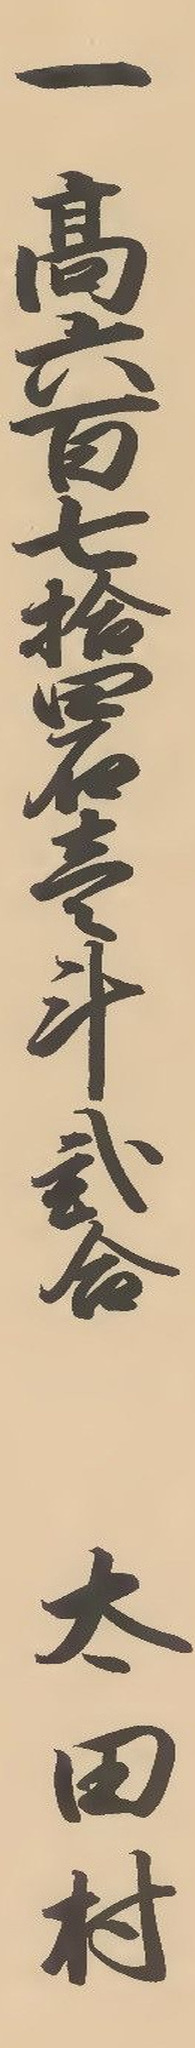一高六百七拾四石壱斗弐合太田村
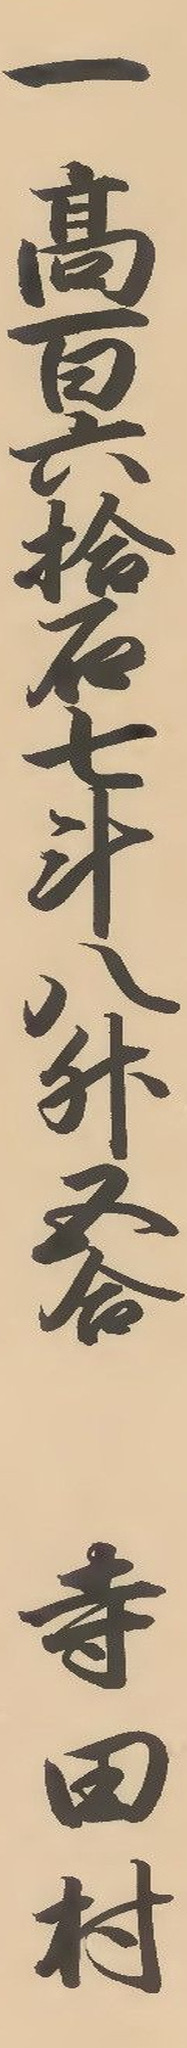一高百六拾石七斗八升五合寺田村
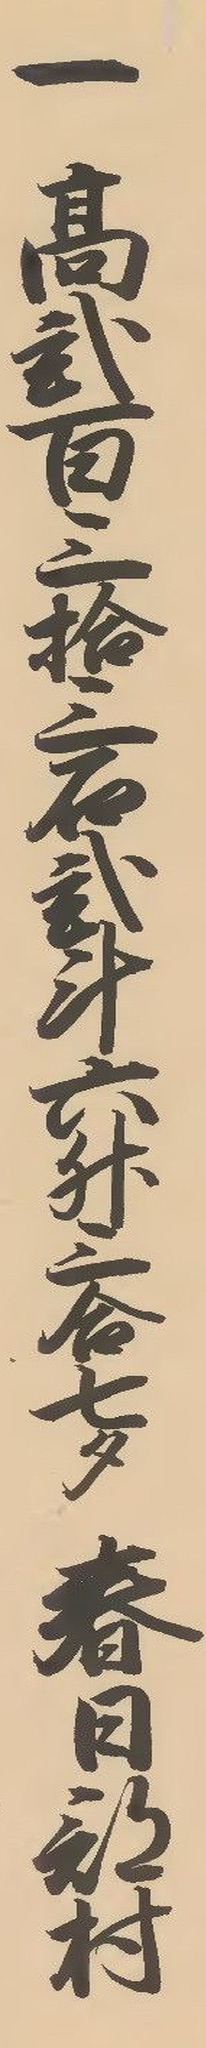一高弐百三拾三石弐斗六升三合七勺春日部村
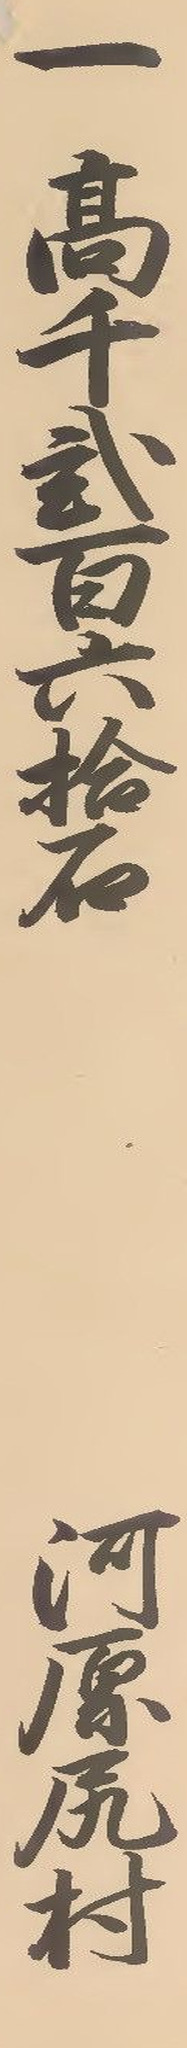一高千弐百六拾石河原尻村

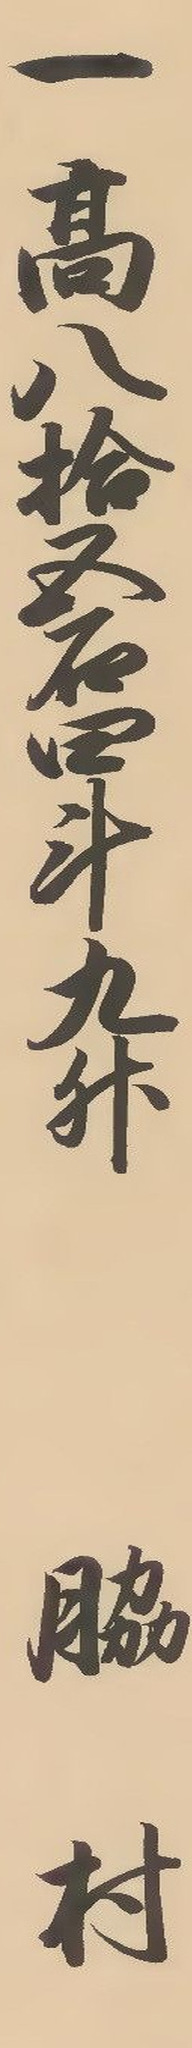一高八拾五石四斗九升脇村
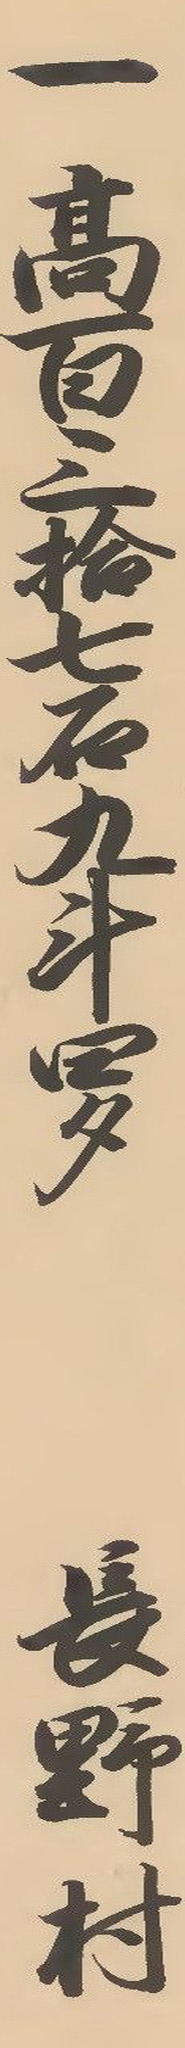一高百三拾七石九斗四勺長野村
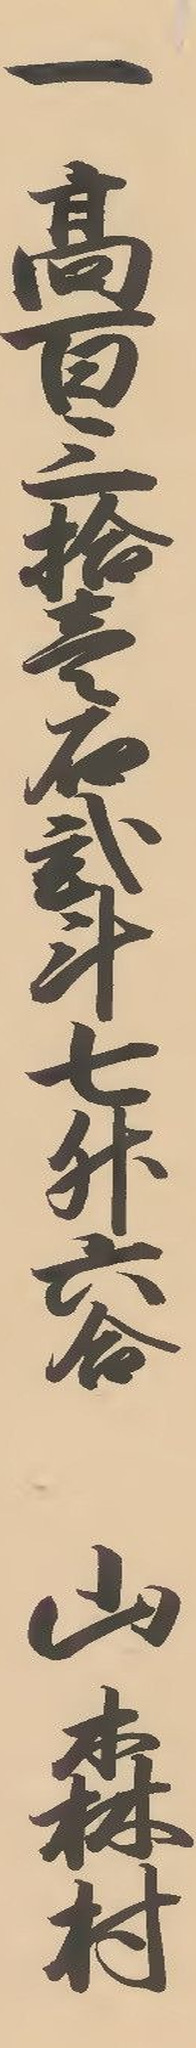一高百三拾壱石弐斗七升六合山森村
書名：丹波国郷帳
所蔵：国立公文書館 National Archives of Japan
